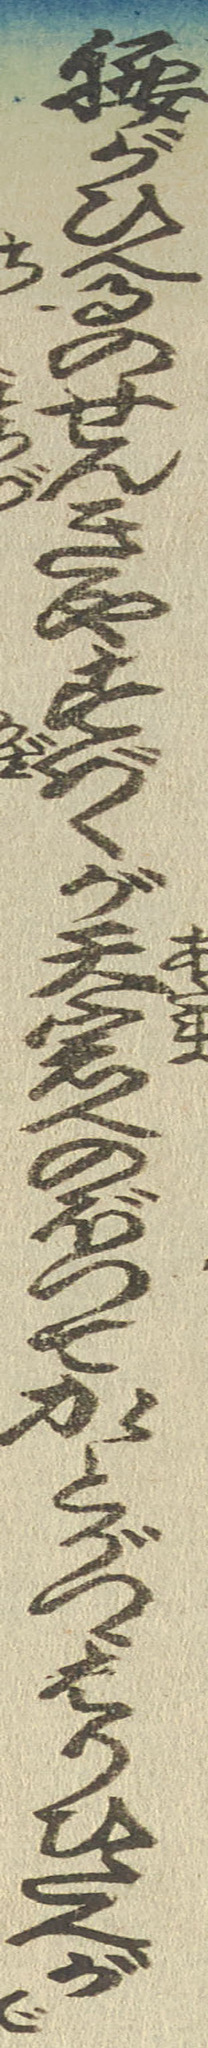腰がひへるのせんきやすバくが天窓へのぼつてかとがつゝはりひたへが
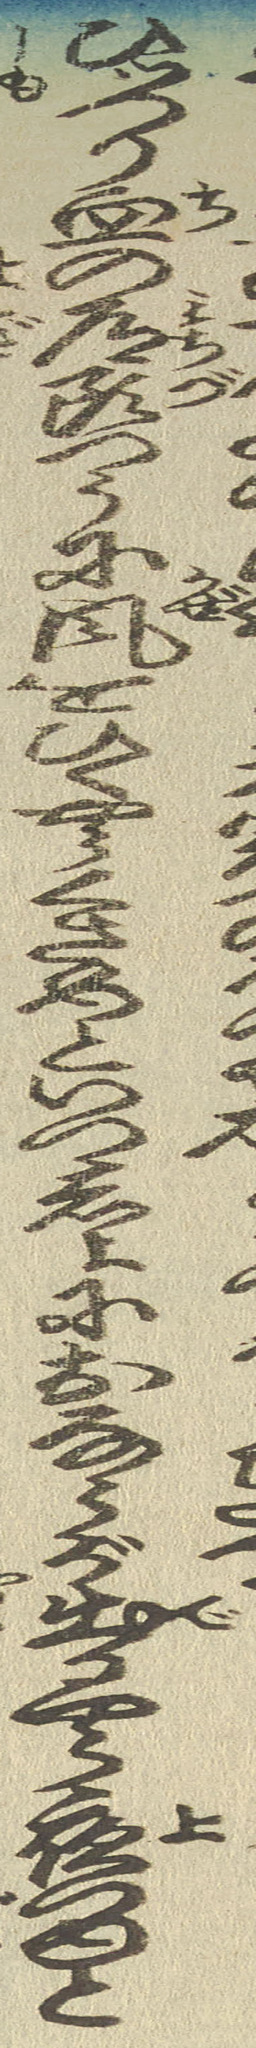ひツつり血の道頭つうに風をひくやうくさめといつしよにおならが出るやら夜つゆと
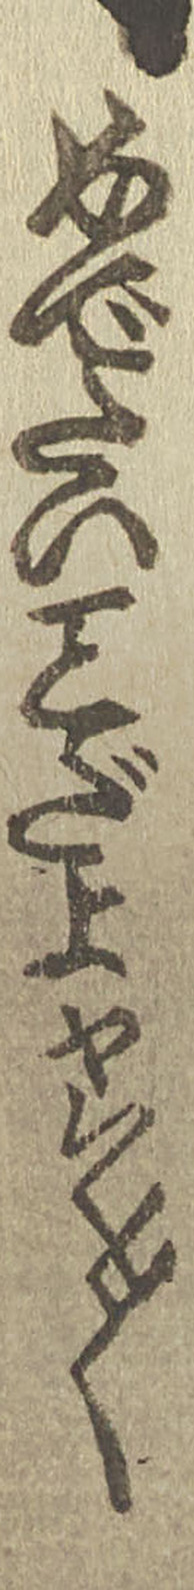めでたいことだよヤレ〳〵〳〵〳〵
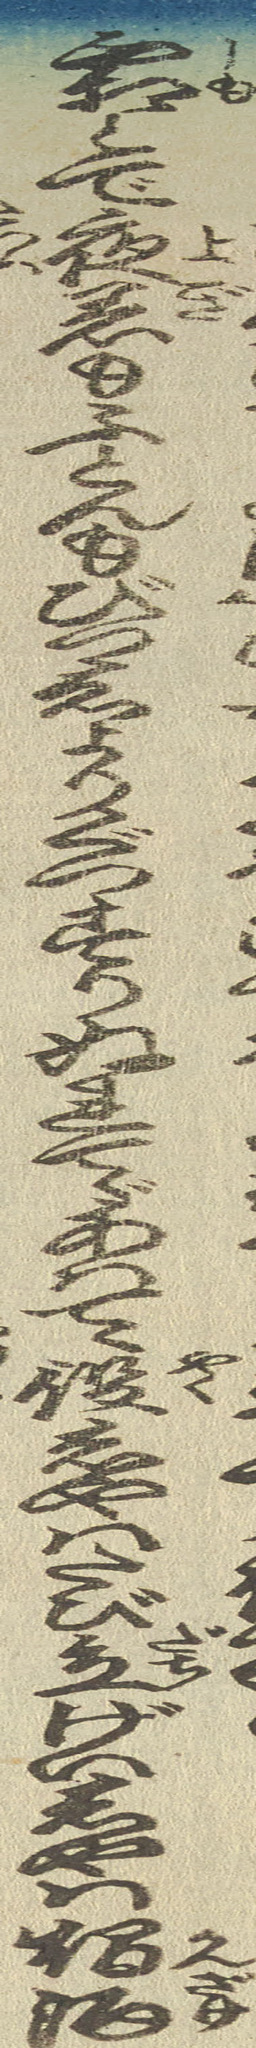霜とで夜着もふとんもびつしよりぐつすりぬれてゞあハてゝ役しやハたび立げいしやハ燗酒
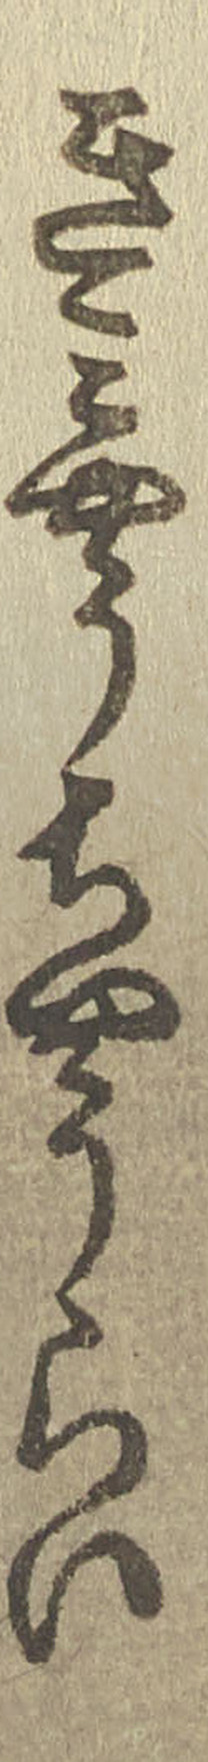きミやうちやうらい
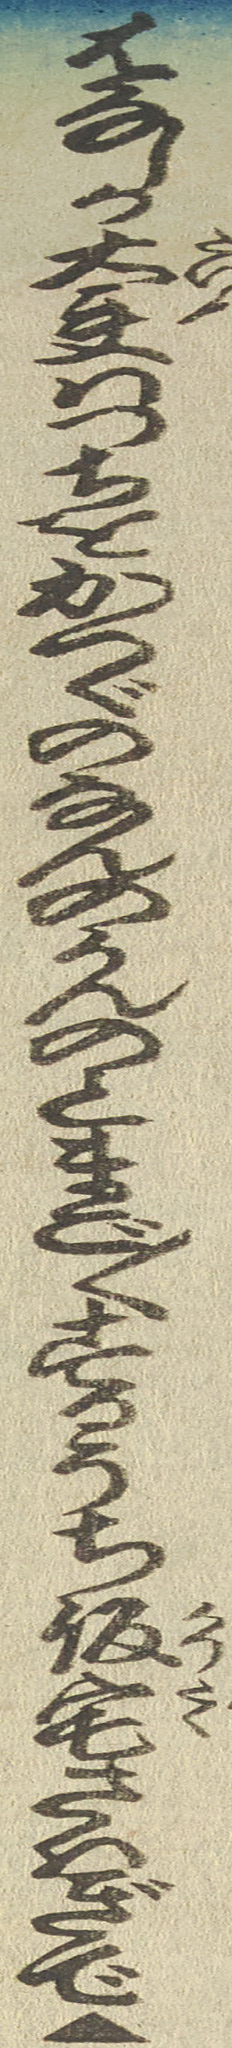はなしか太夫ハつちをかつぐのなんのかんのとまご〳〵するうち仮宅さハぎで
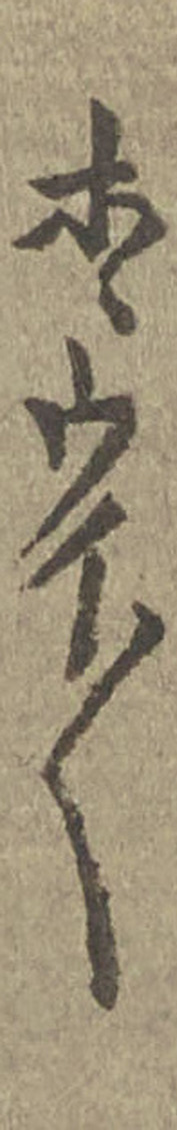ホヽウイ〳〵
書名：どらが如来世直し ちょぼくれ
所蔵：東京大学総合図書館 General Library in the University of Tokyo, JAPAN
